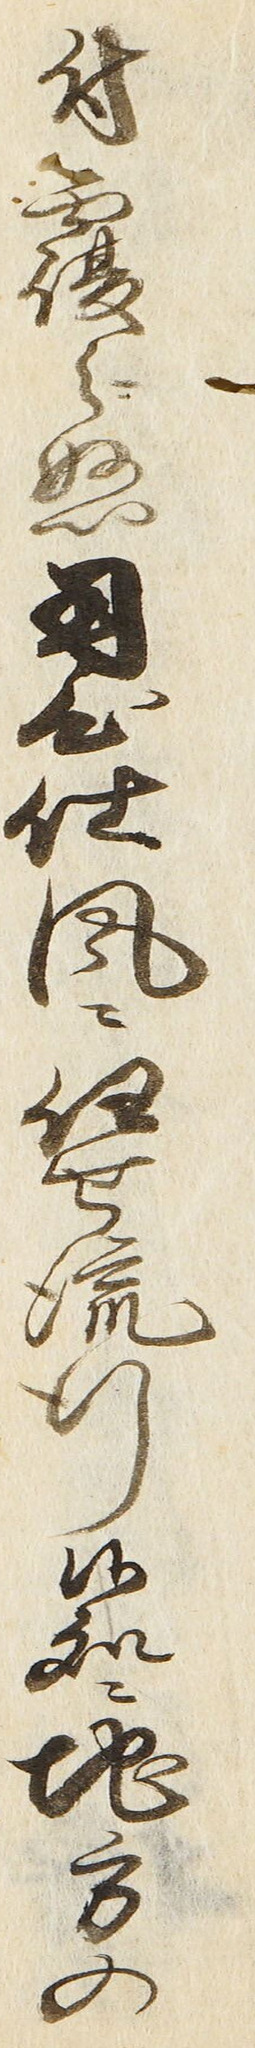付覆らぬ用心仕候風ニ任せ流行候処ニ地方の
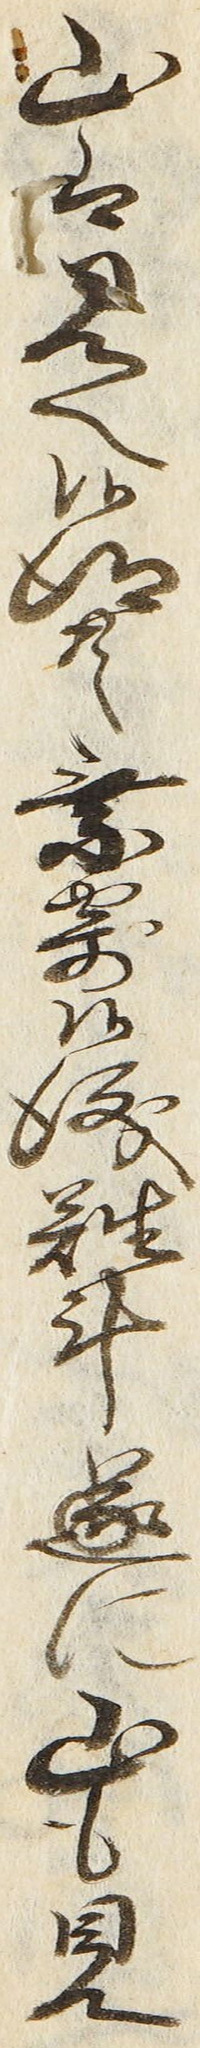山は見へ候得共乗寄候儀難斗遂に山も見
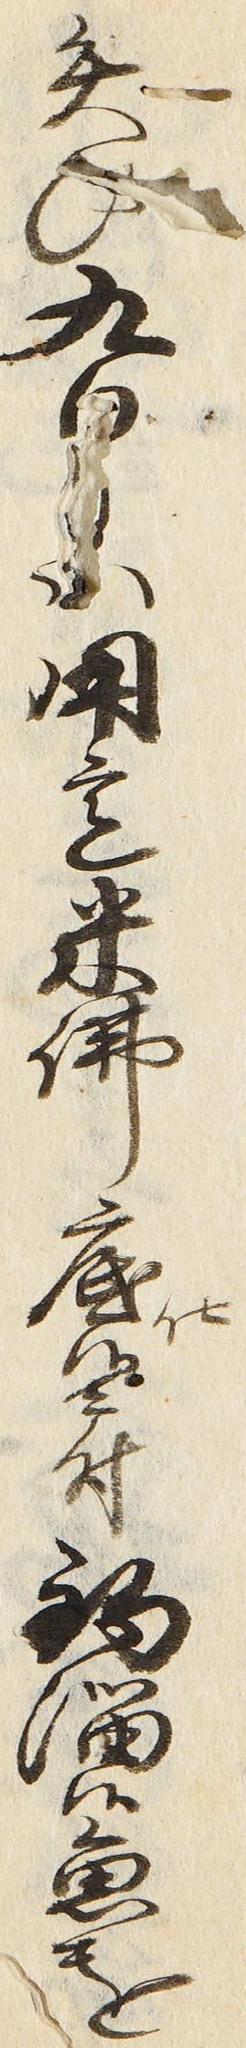失ひ九日目ハ用意米佛底仕候ニ付釣溜候魚を
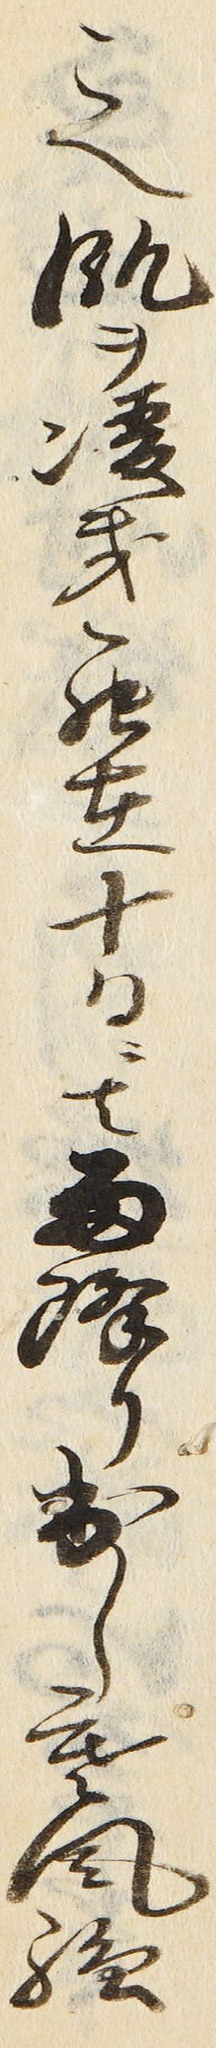たへ飢えヲ凌き罷在十日ニ者雨降り出し寒風強
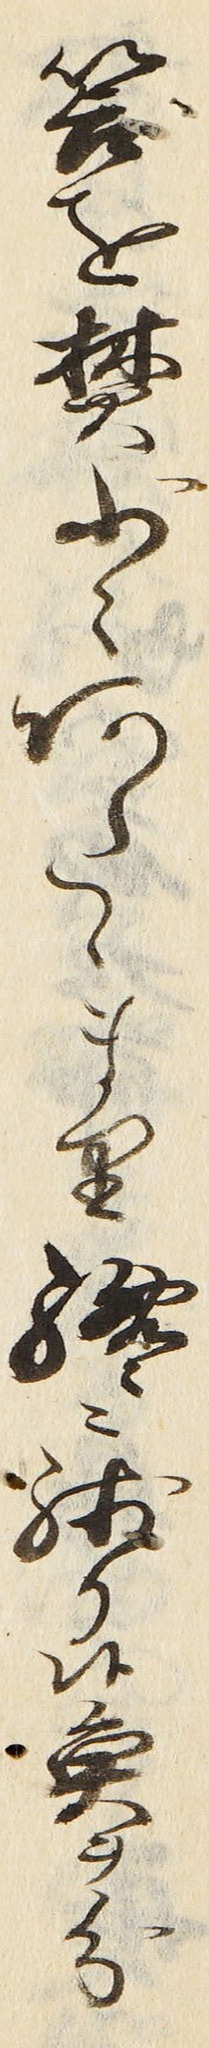苫を焚少々あたゝまり纔ニ残り候𩵋ヲ分
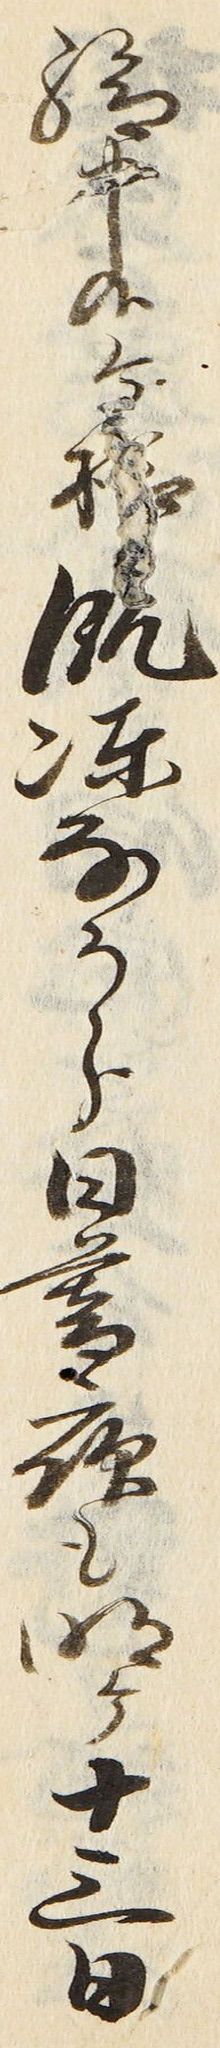給申候ケ様飢凍なから日暮夜も明ケ十三日
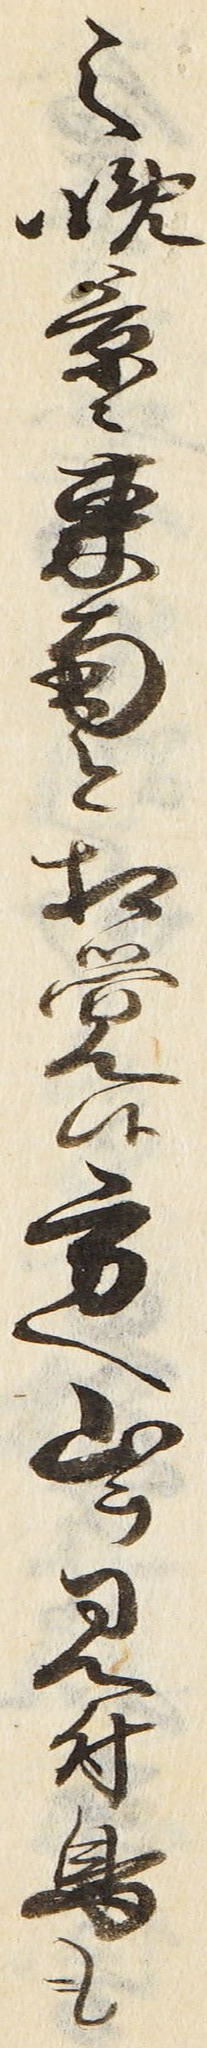之晩景ニ東南と相覚候方へ山ヲ見付島も
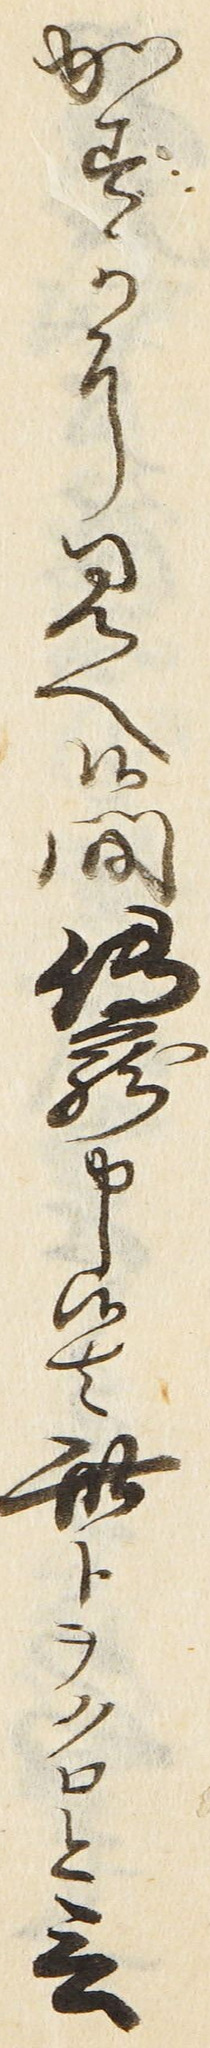かすかに見へ候間傳蔵申候者此トヲクロという言
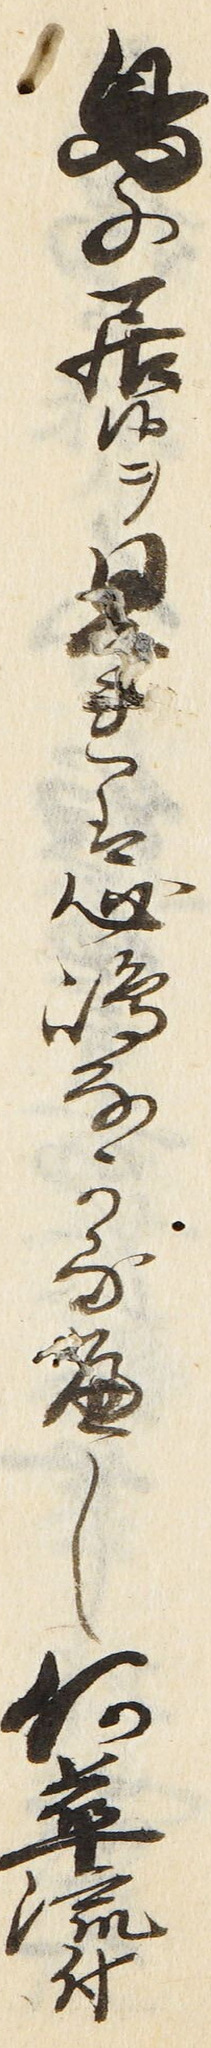島の居候ヲ見れは必嶋なかるへし何卒流付
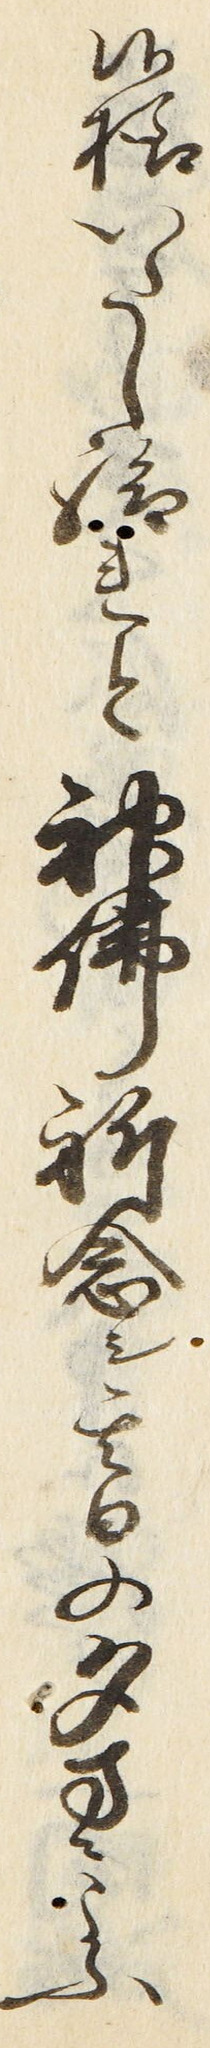候様いたし給れと神佛祈念シ其日の夕方ニとふ
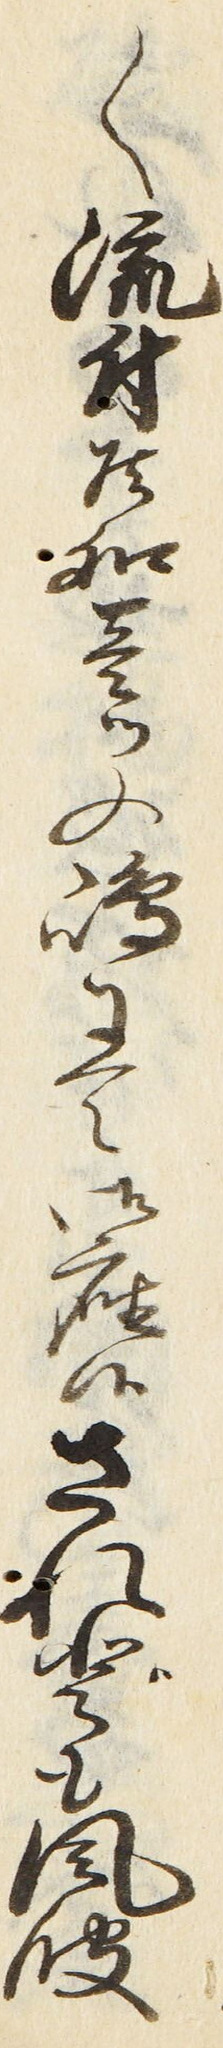〳〵流付候処壱ツの嶋にて御座候されども風波
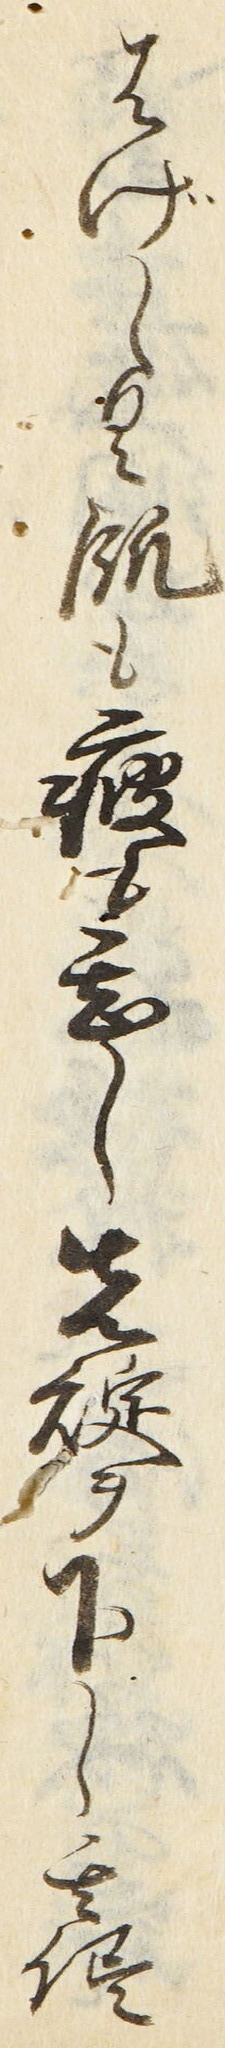はげしく飢も疲も甚し先碇ヲ下し其儘
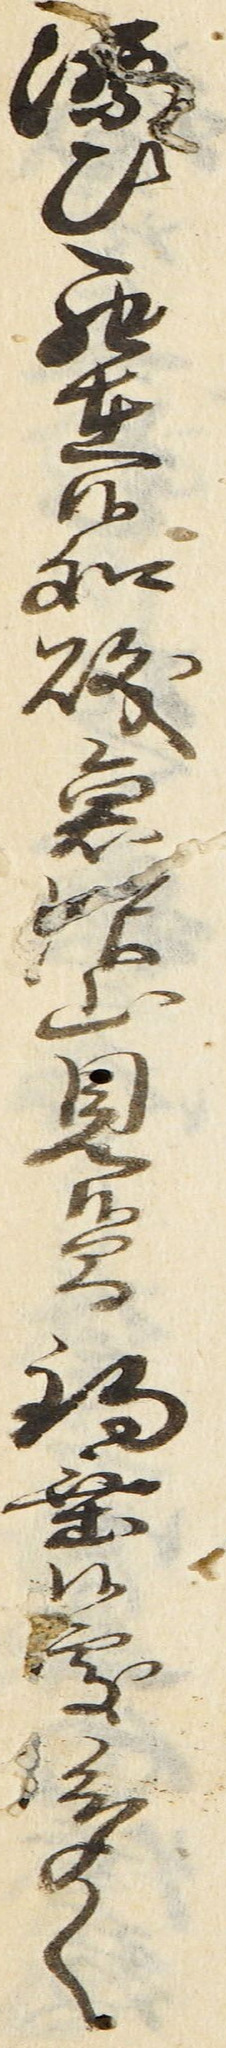漂ひ罷在候処磯𩵋沢山見候間釣垂候處多く

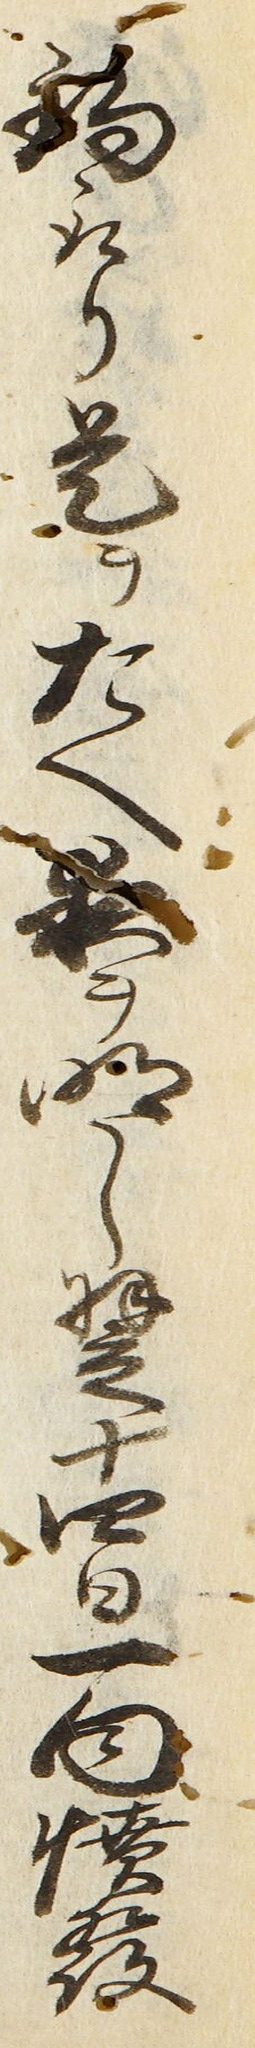釣取り是ヲたへ夜ヲ明し翌十四日一同憤發
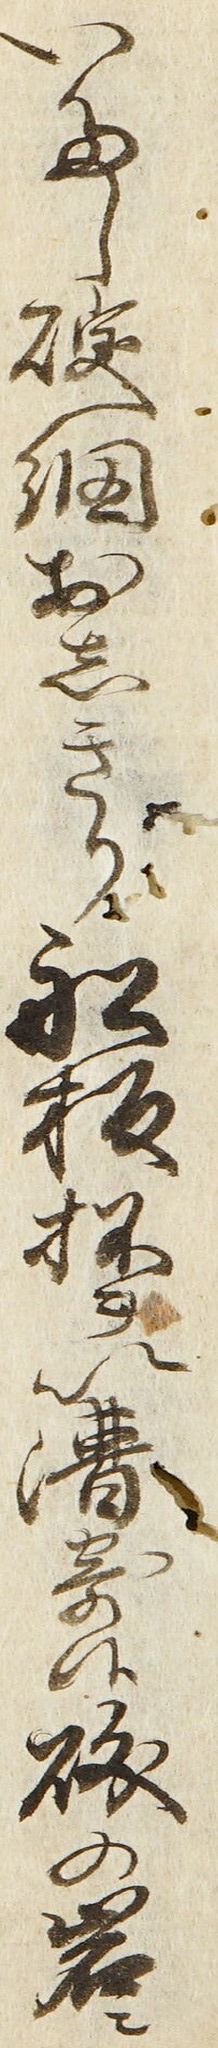いたし碇綱おしきり舩板抔ヲ以漕寄候磯の岩ニ
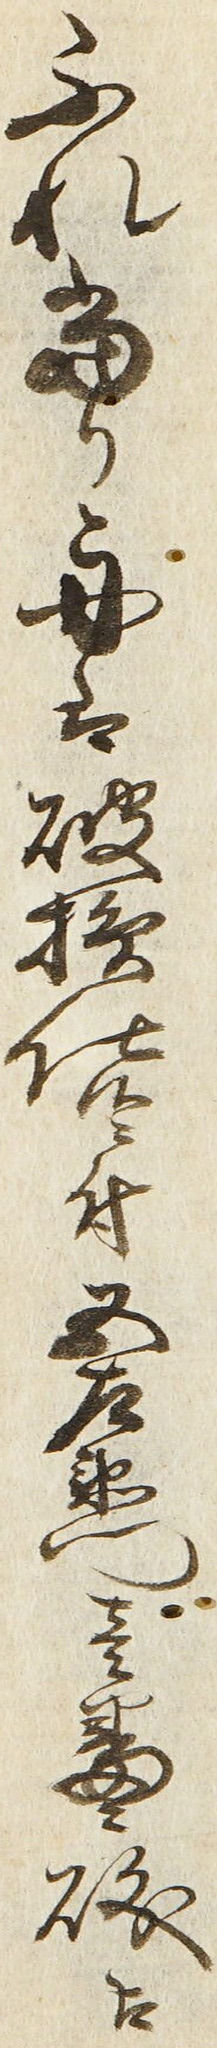ふれ當り舟は破損仕候ニ付五左衛門壱番ニ磯江
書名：漂客談寄
